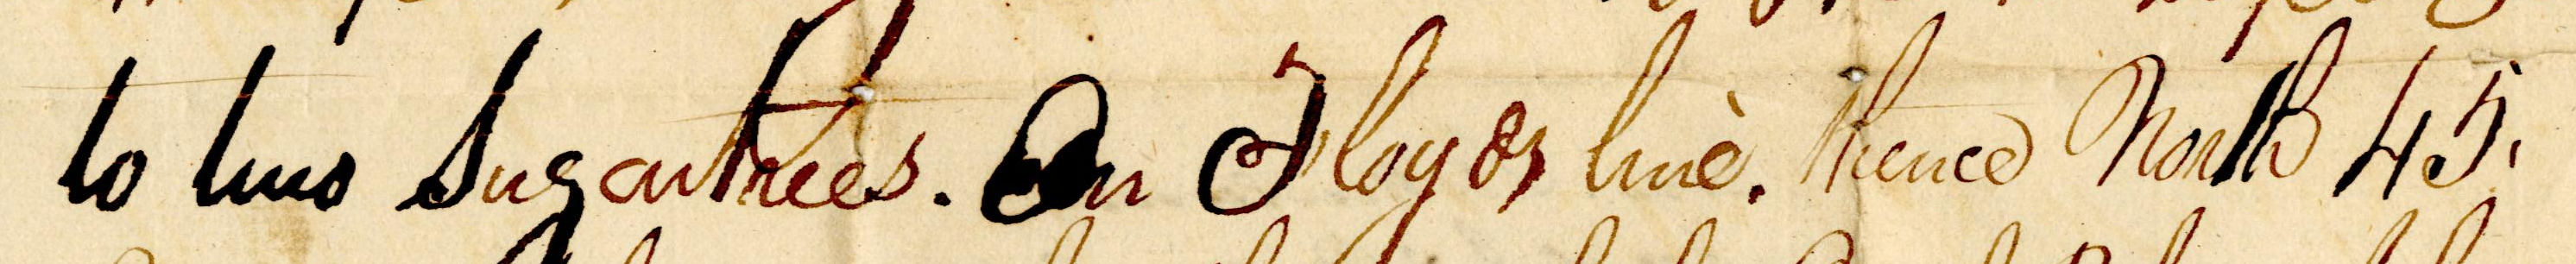to two Sugartrees. On Hayes line, Shared North 45.
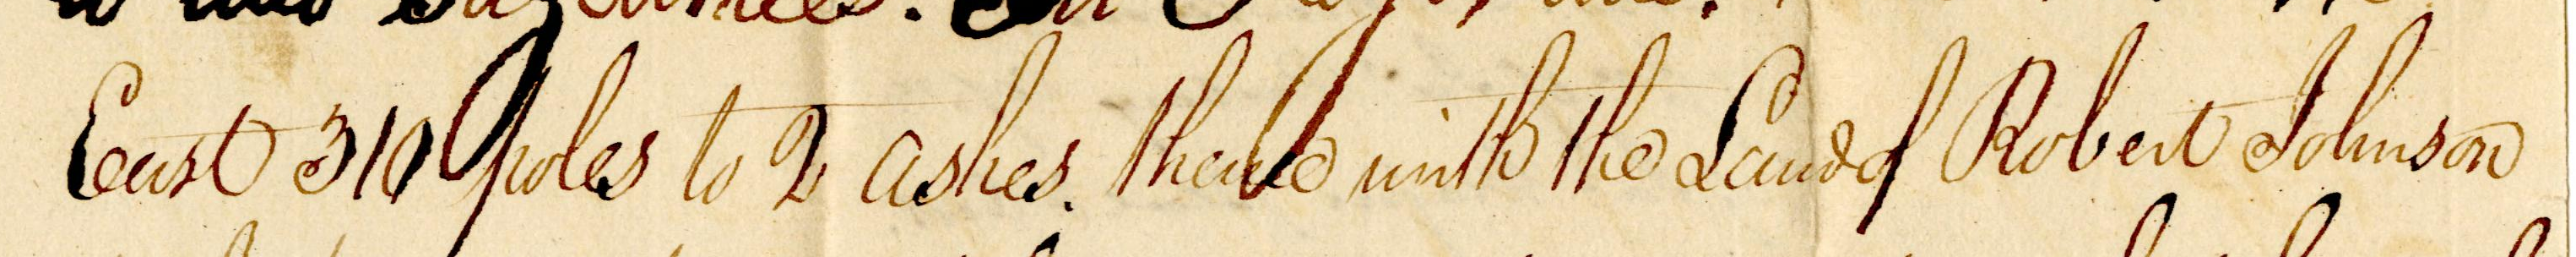East 310 poles to 2 ashes. thence with the Land of Robert Johnson
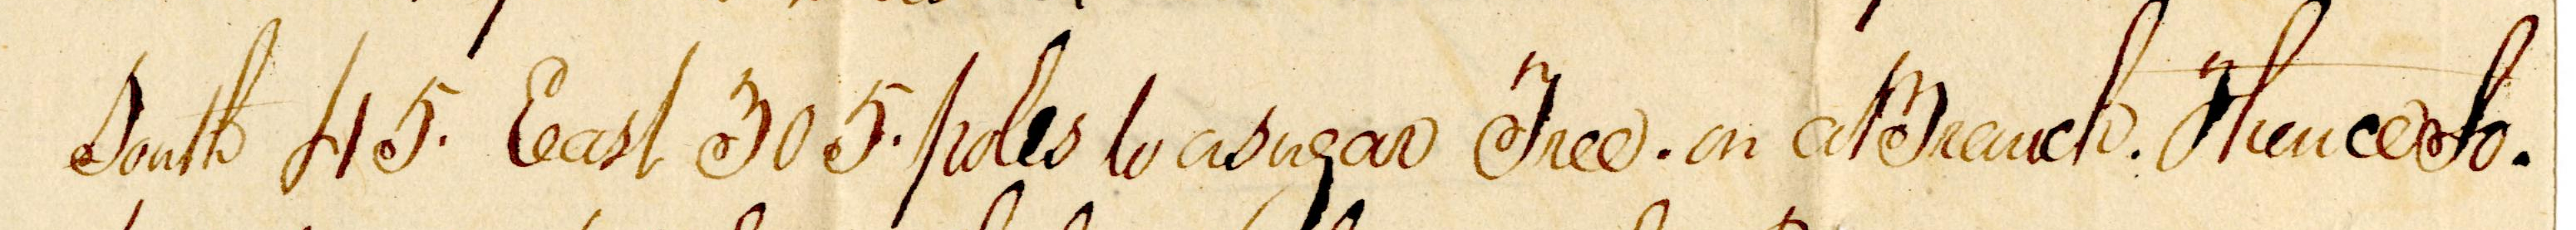South 45. East 305 Poles to a sugar Tree. on a Branch. thence So.
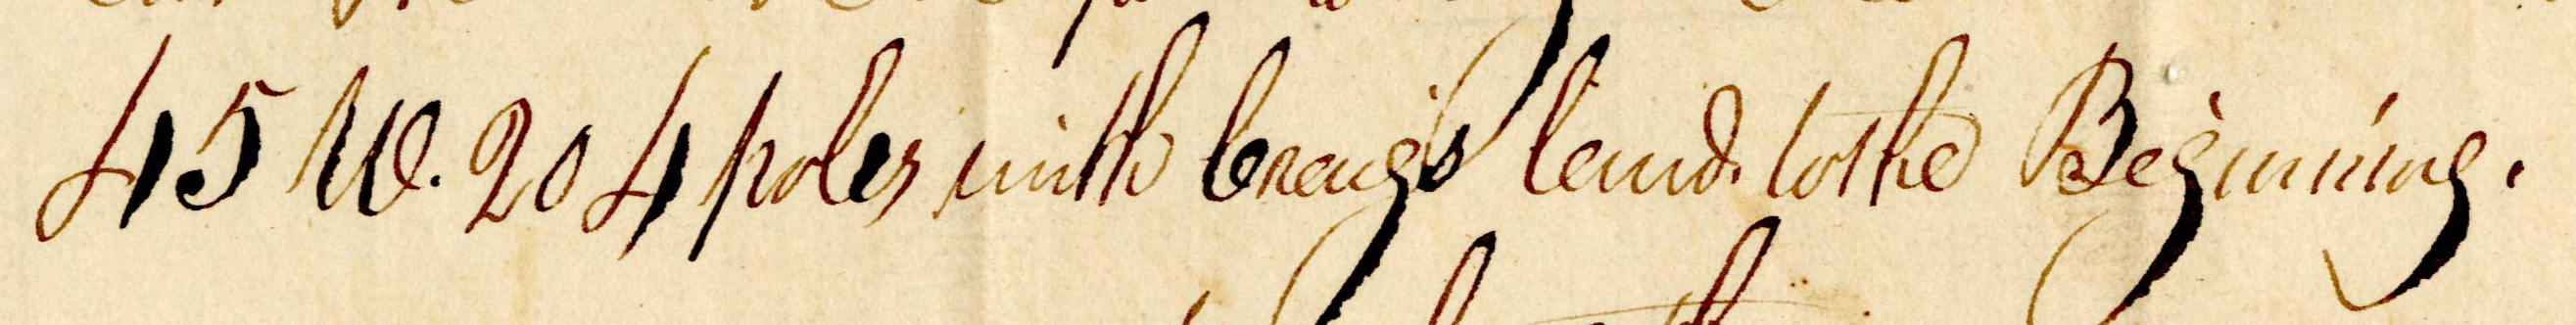45 W. 204 poles with Craigs Land to the Beginning.
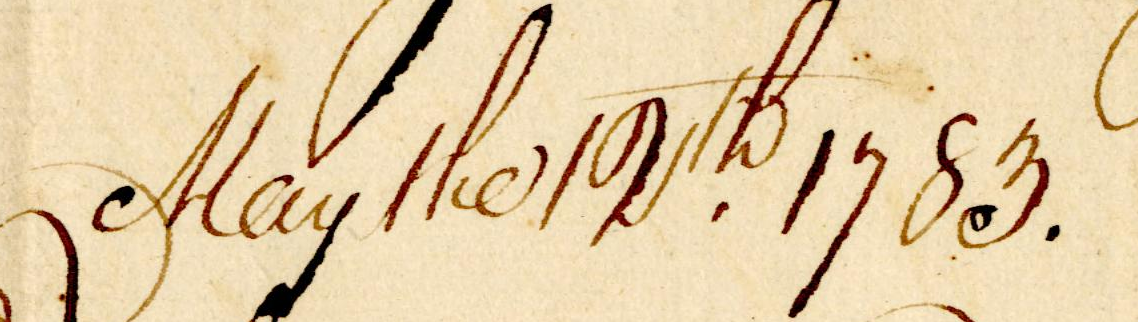May the 12^th. 1783
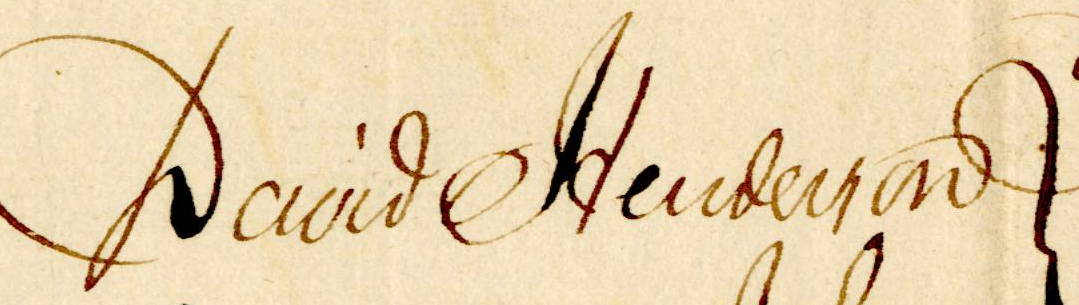David Henderson
